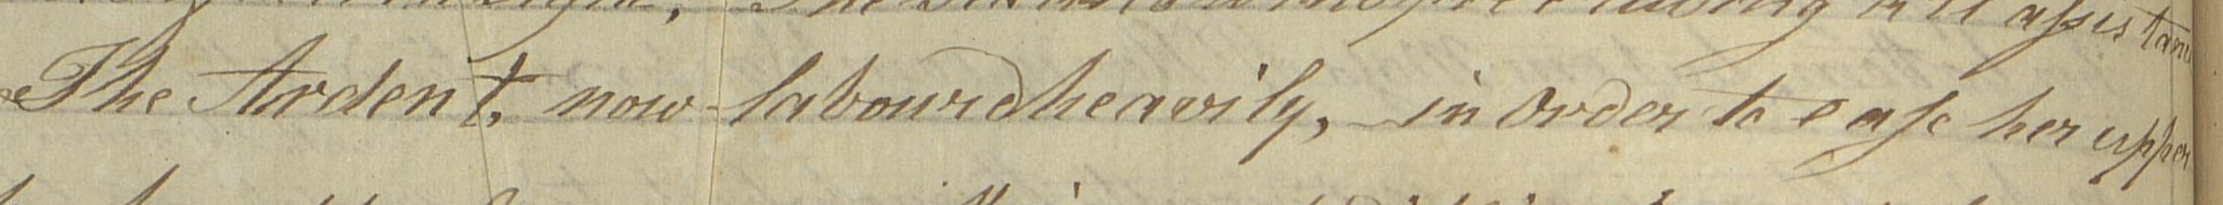The Ardent now labourd heavily, in order to ease her upper
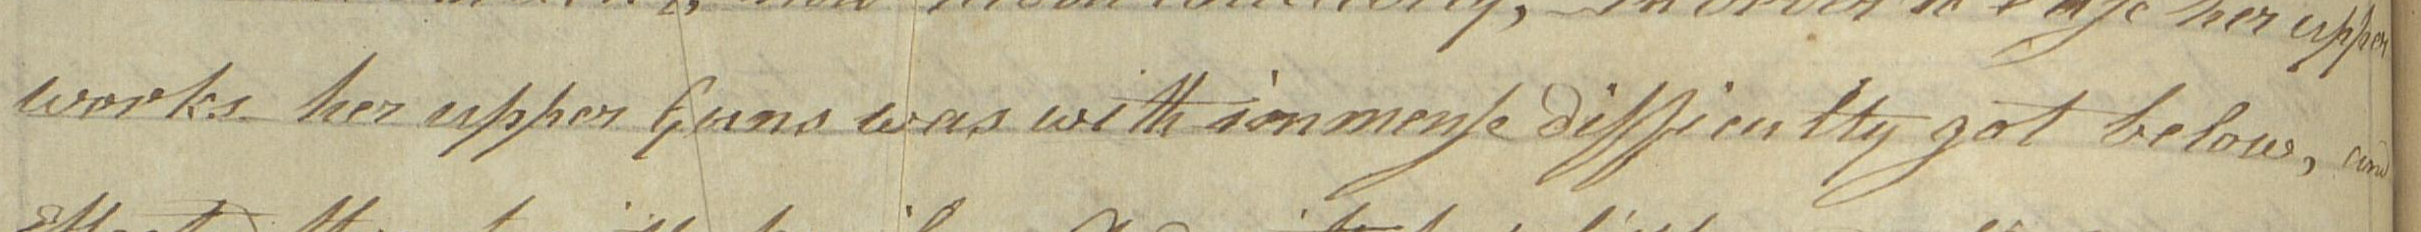works her upper Guns was with immense difficulty got below, and
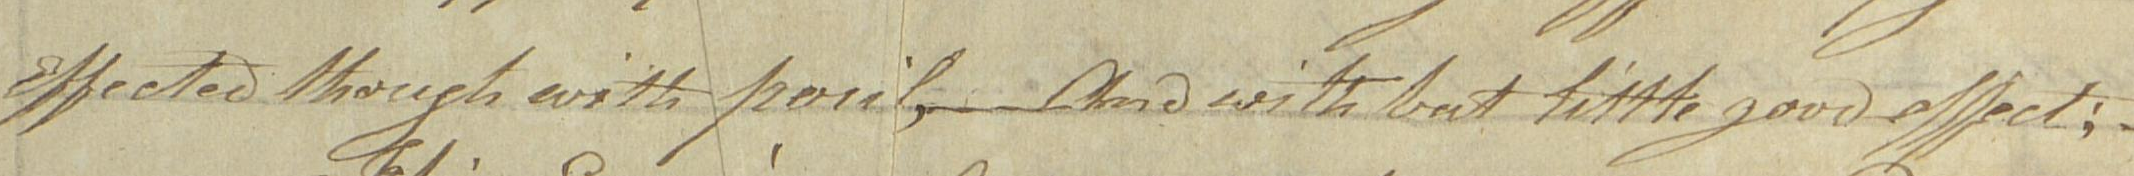Effected though with poul, And with but little good effect;
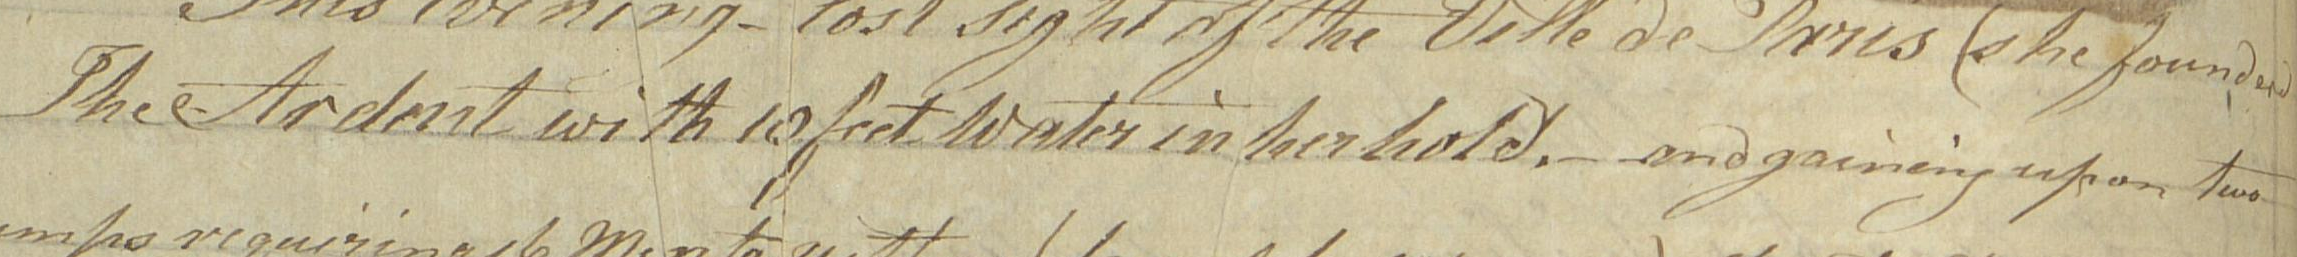The Ardent with 10 feet Water in her hold, and gaining upon two
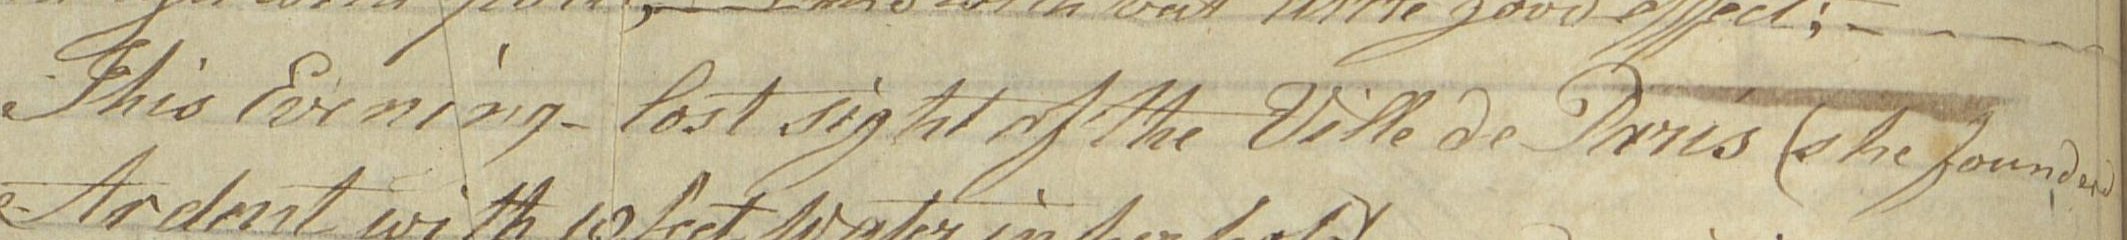This Evening, lost sight of the Ville de Paris (she founded
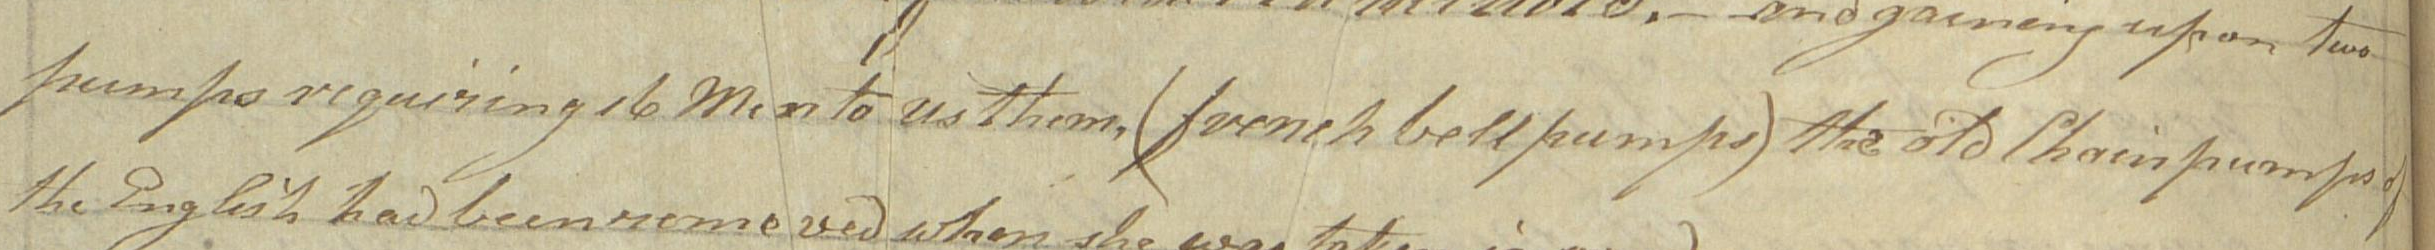pumps requiring 16 Men to us them (french bell pumps) the old Chain pumps of
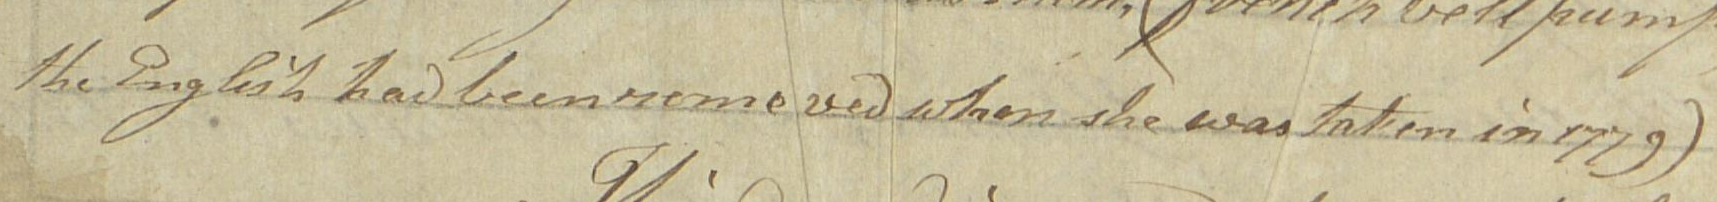the English had been removed when she was taken in 1779)
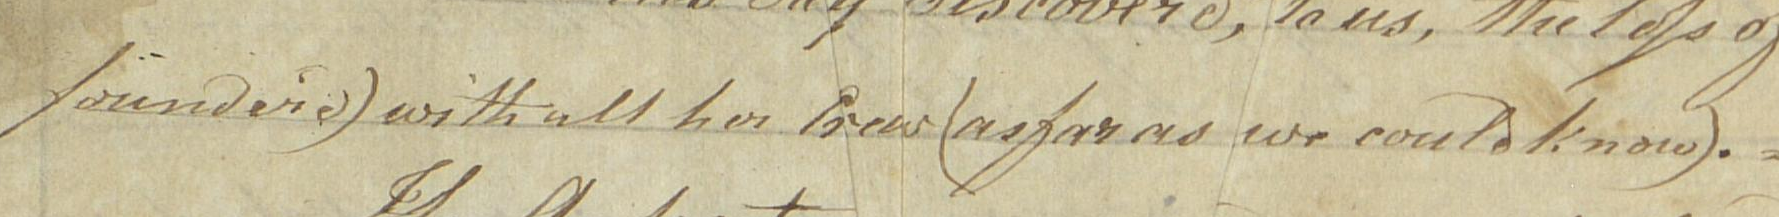founderd) with all her Crew (as far as we could know).
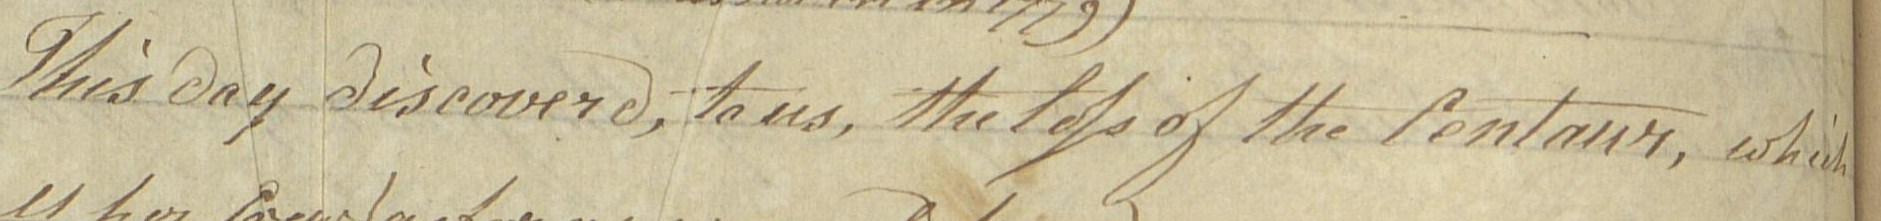This day discoverd, to us, the loss of the Centaur, which
